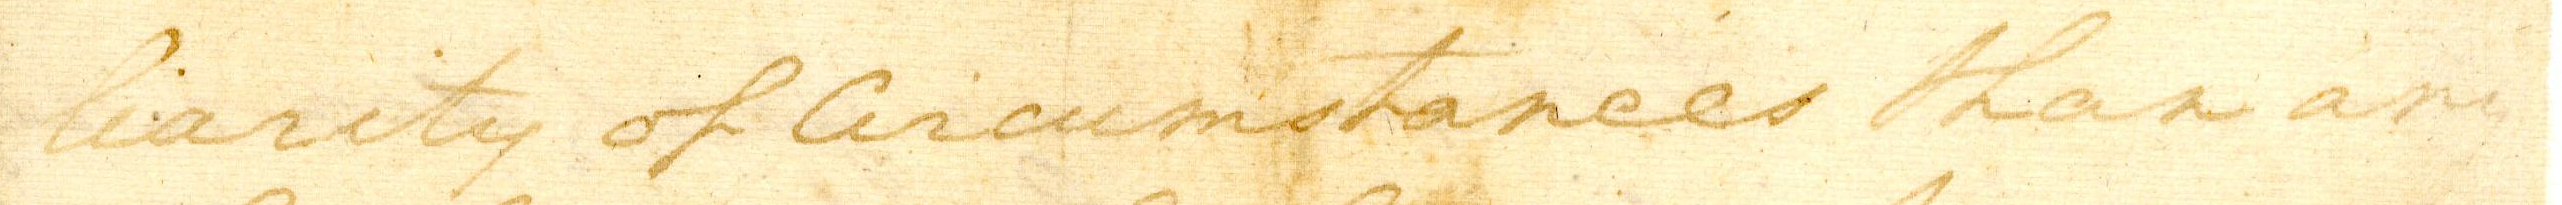liarity of Circumstances than any
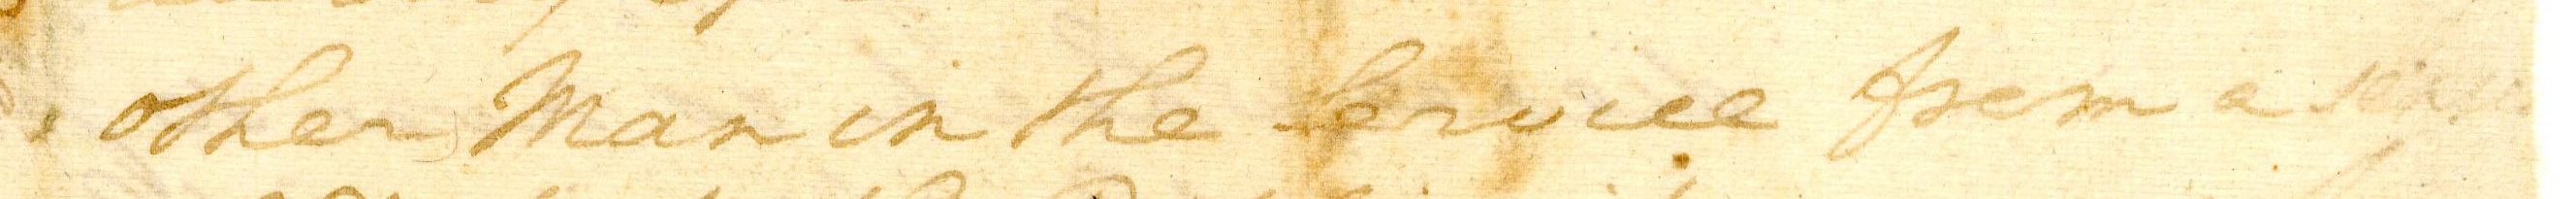other Man in the service from a serv
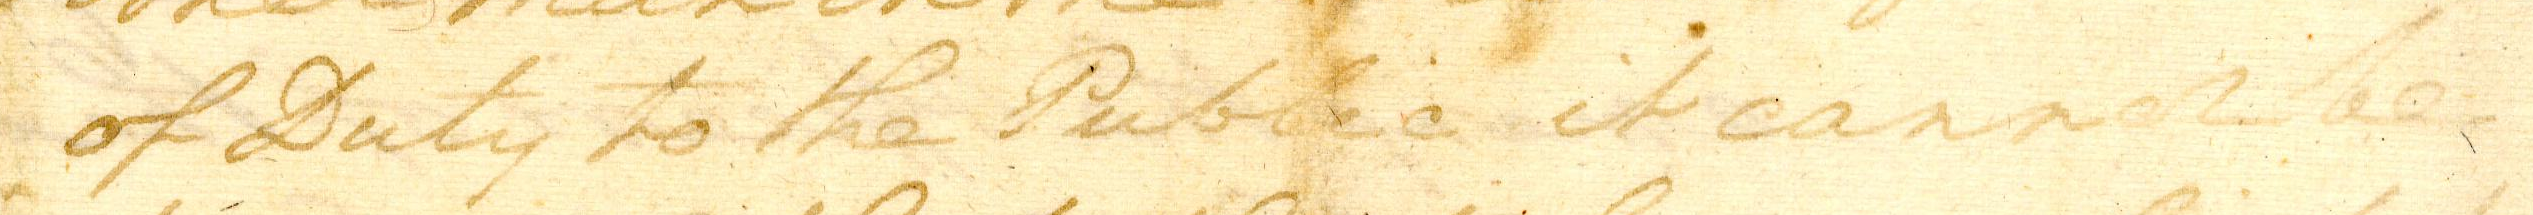of Duty to the Public it cannot be
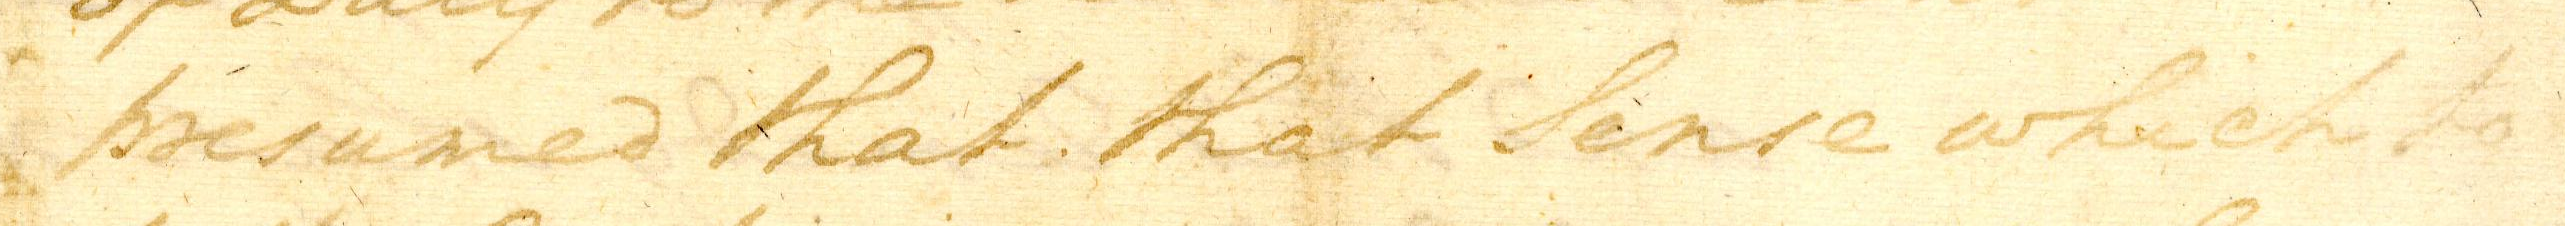presumed that the Sense which to
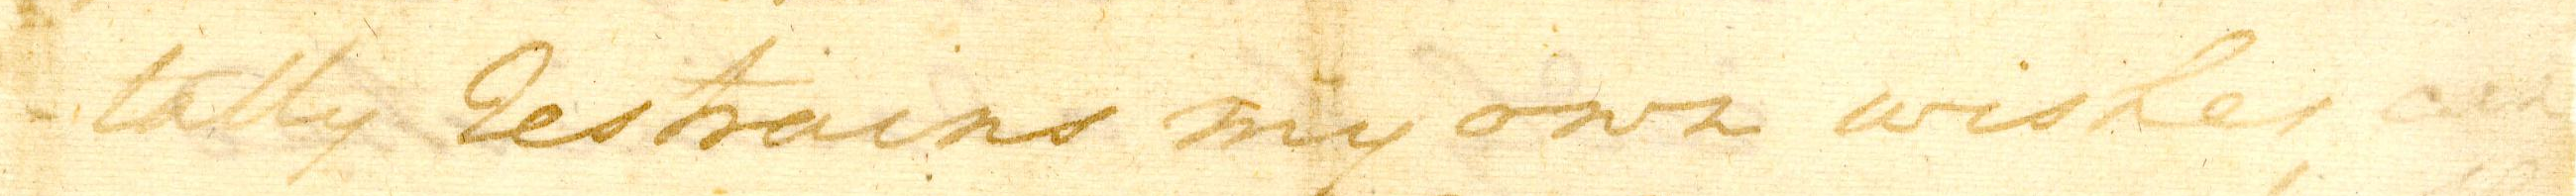tally restrains my own wishes can
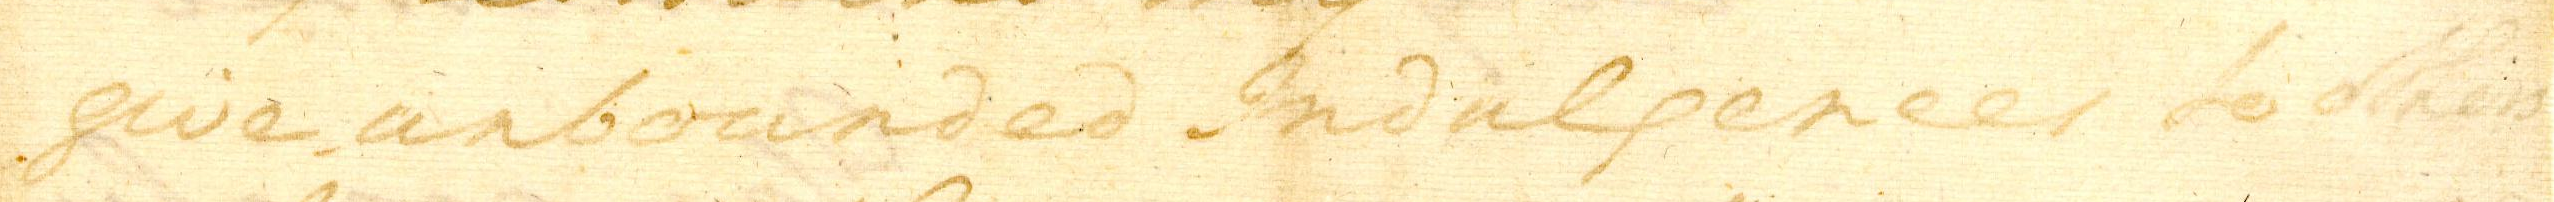give unbounded Indulgences to others
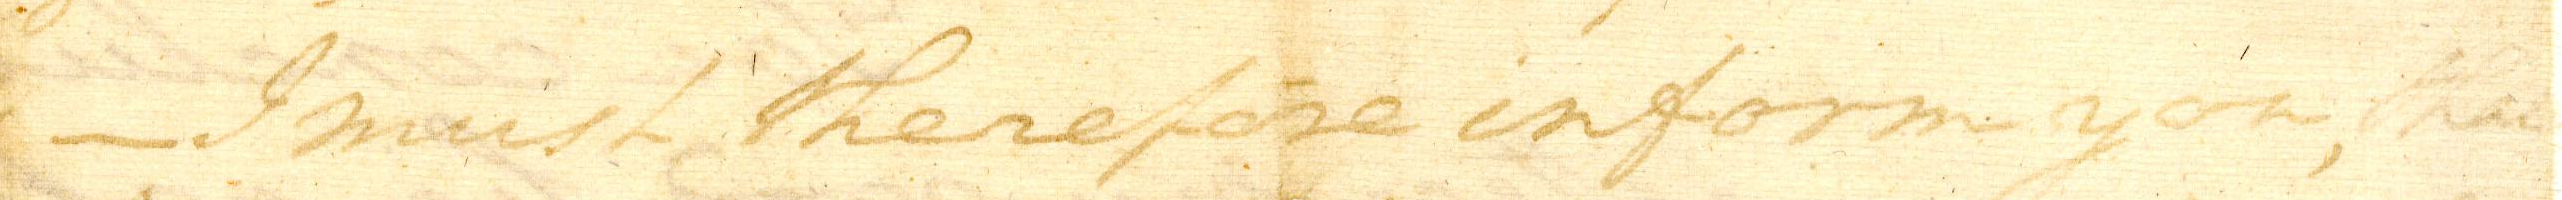- I must therefore inform you, that
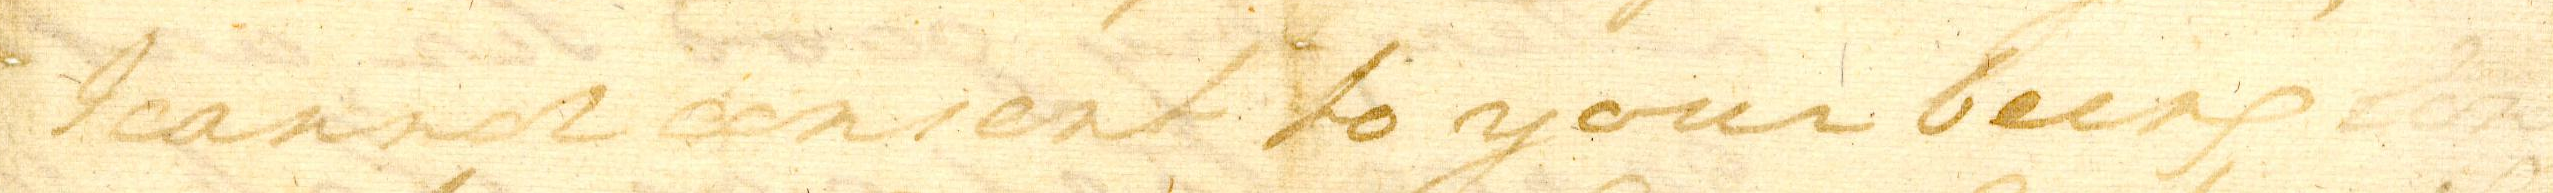I cannot consent to your being lon
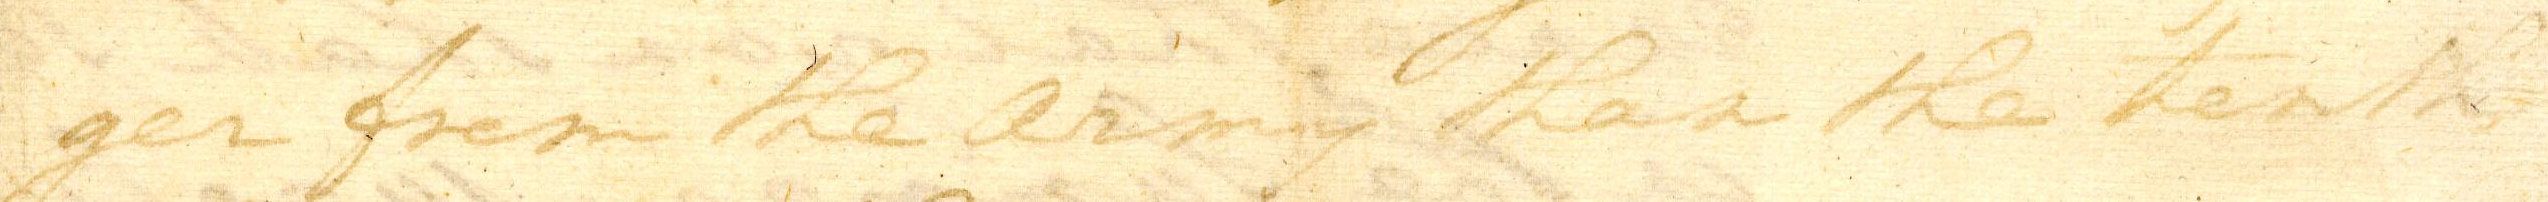ger from the Army than the tenth
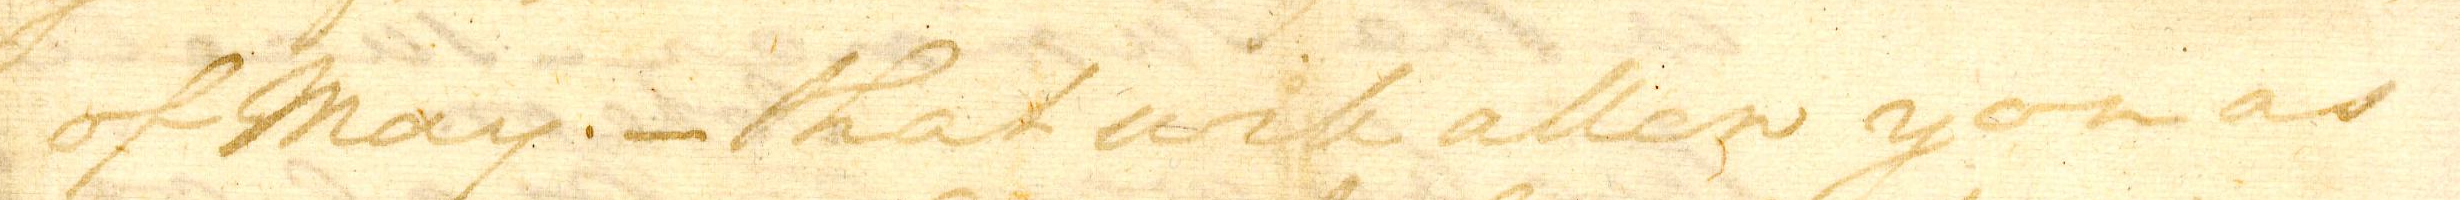of May.- that will allow you as
